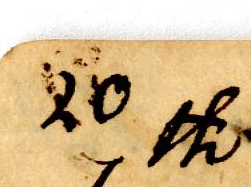20
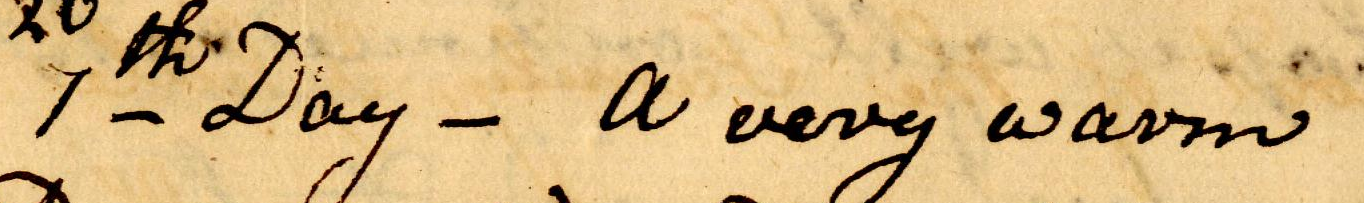7^th Day- A very warm
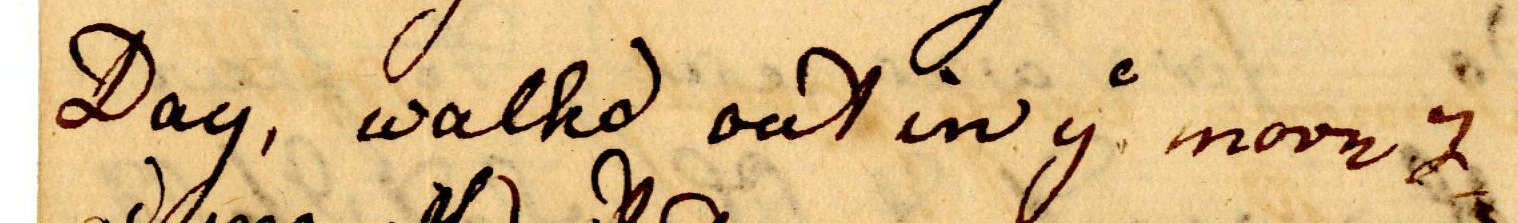Day, walkd out in y^e morn^g
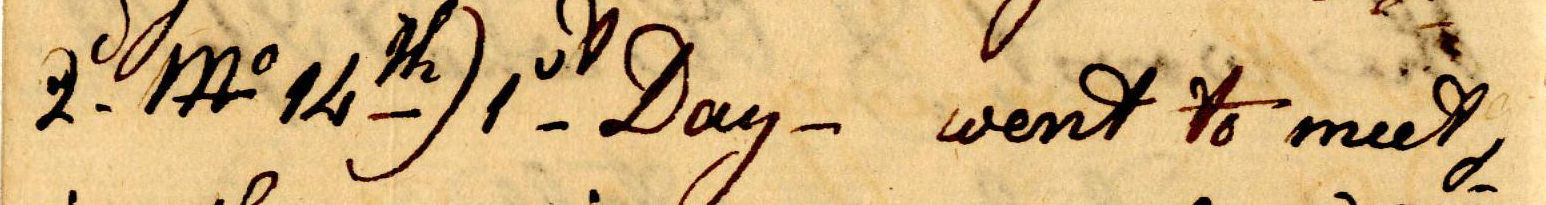2^d M^o 14^th) 1^st Day- went to meet^g
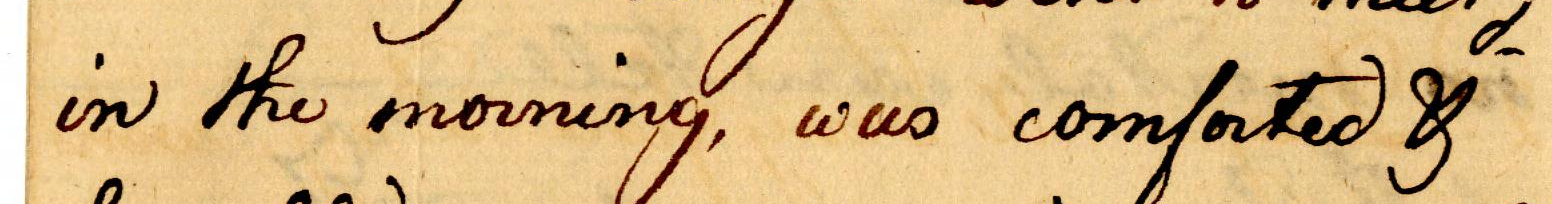in the morning, was comforted &
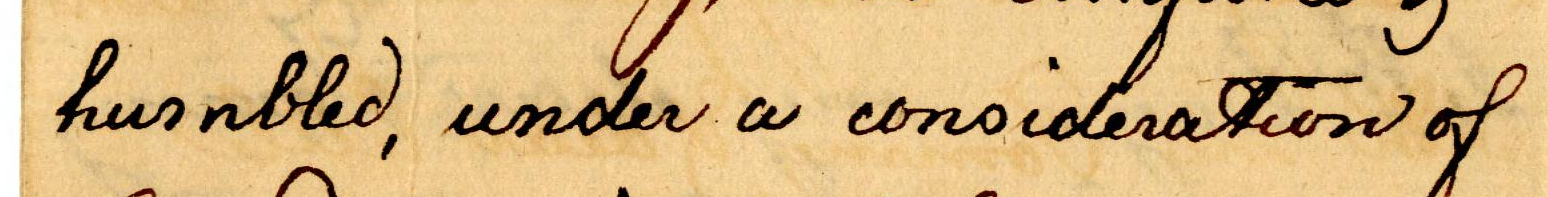humbled under a consideration of
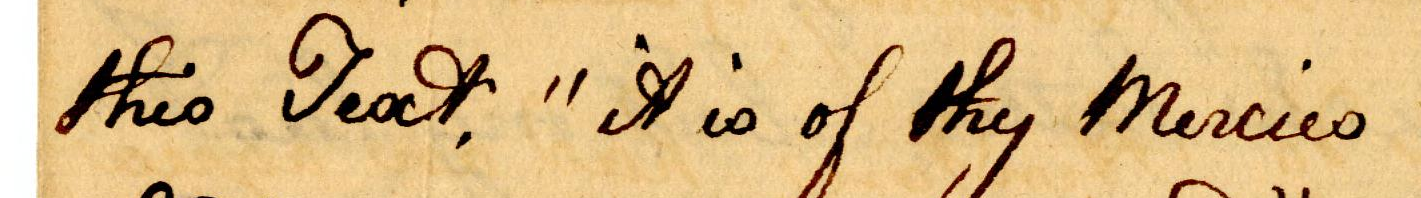this Text "it is of thy Mercies
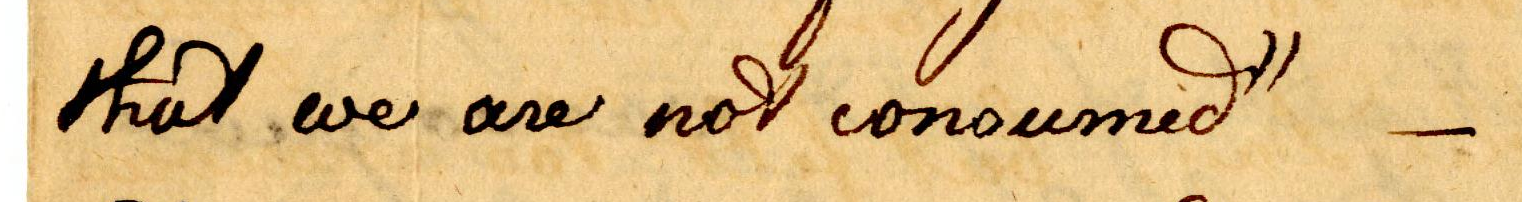that we are not consumed"
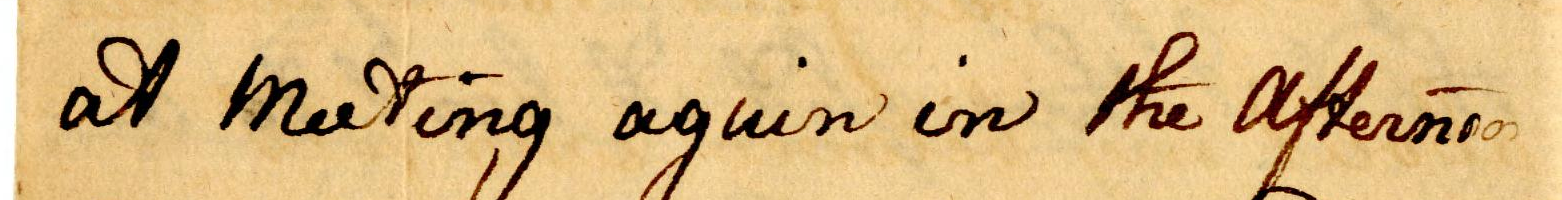at Meeting again in the Afternoon
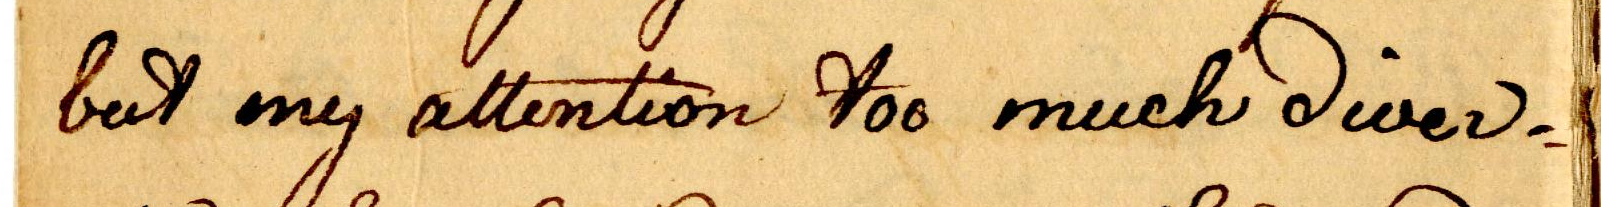but my attention too much diver-
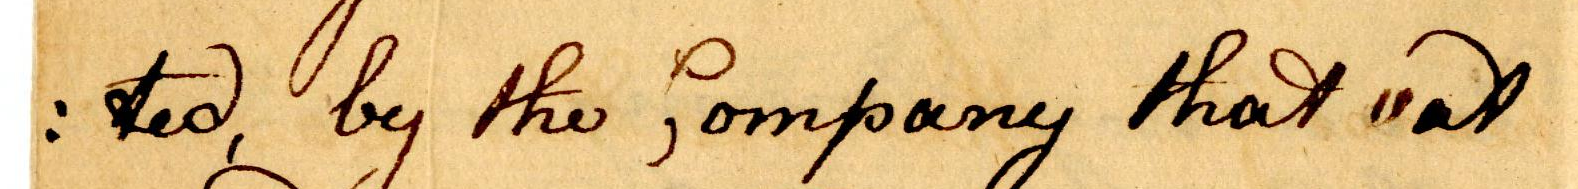-ted, by the Company that sat
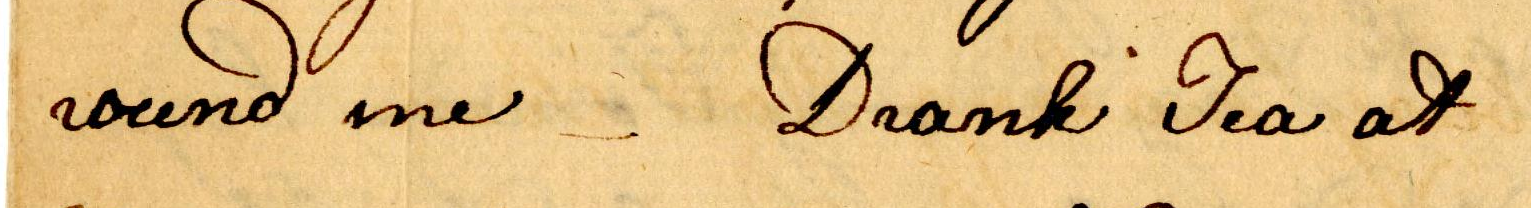round me Drank Tea at
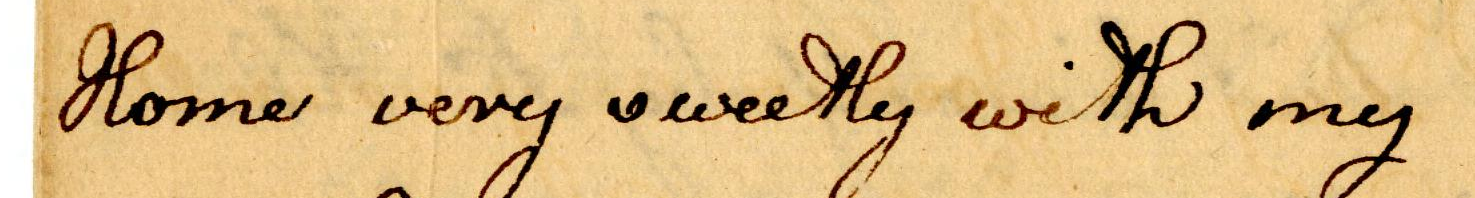Home very sweetly with my
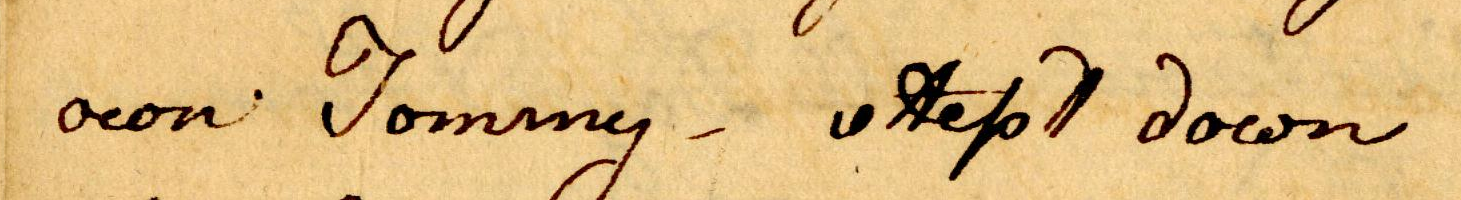own Tommy- stept down
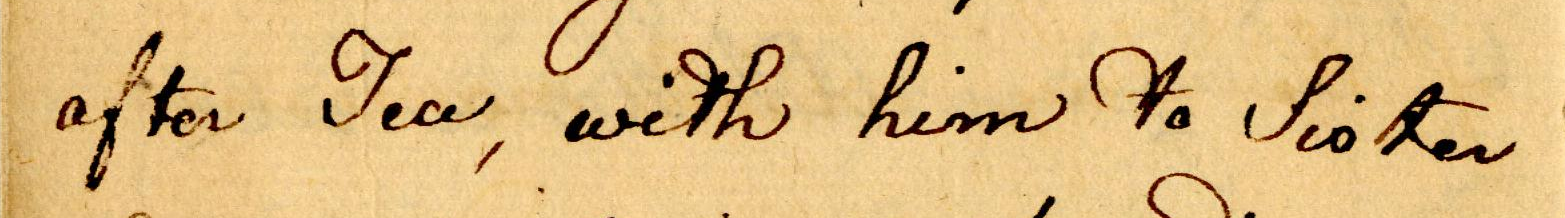after Tea, with him to Sister
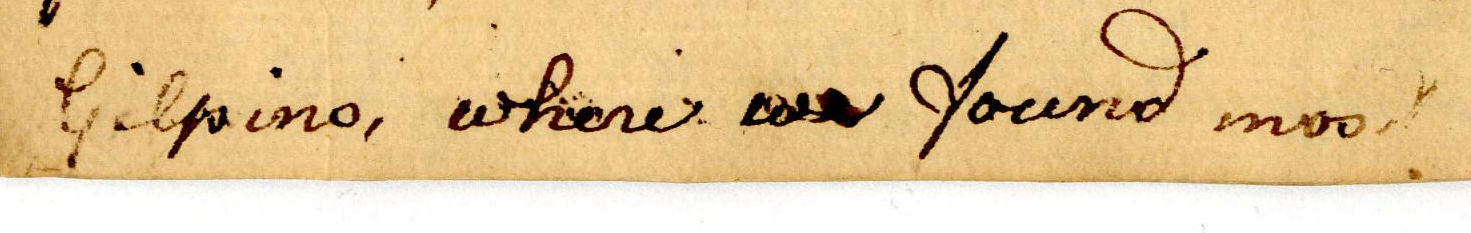Gilpins, where we found most
